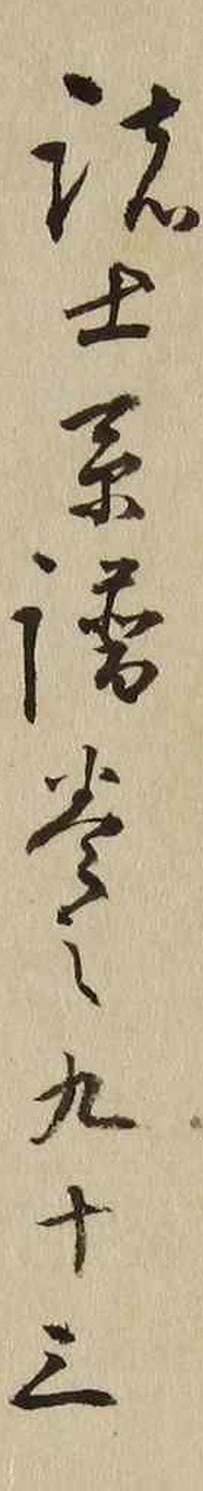諸士系譜巻之九十三
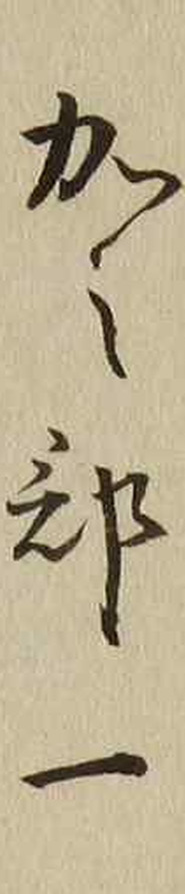か之部一
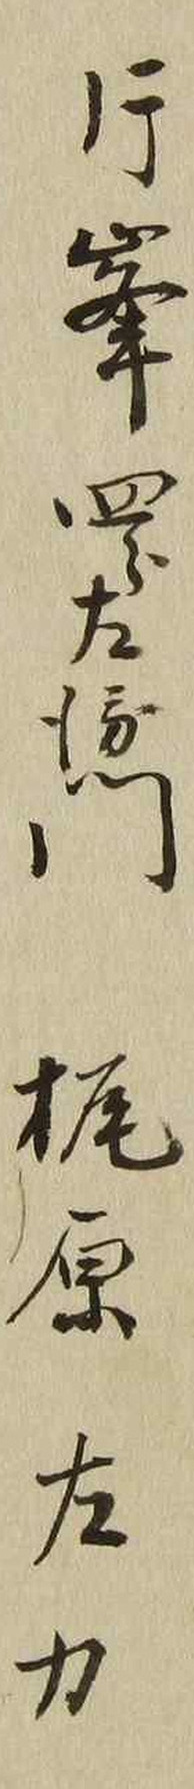片峰四郎左衛門梶原左力
